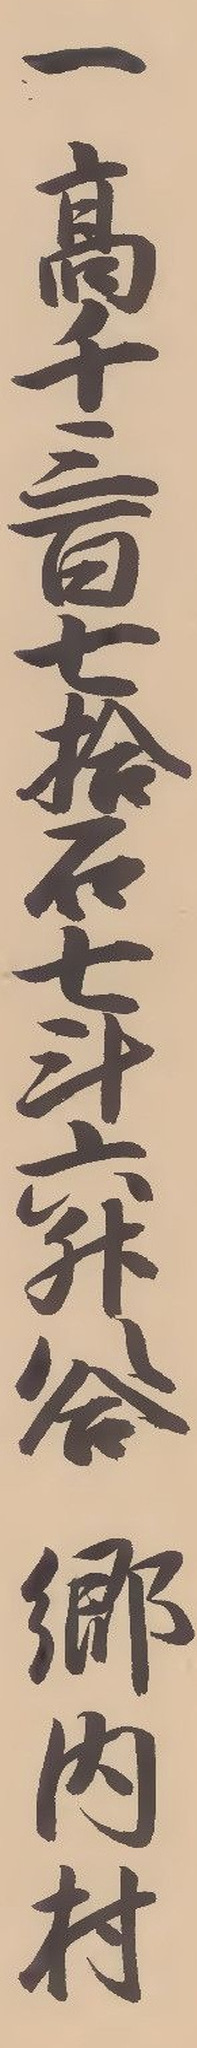一高千三百七拾石七斗六升八合郷内村
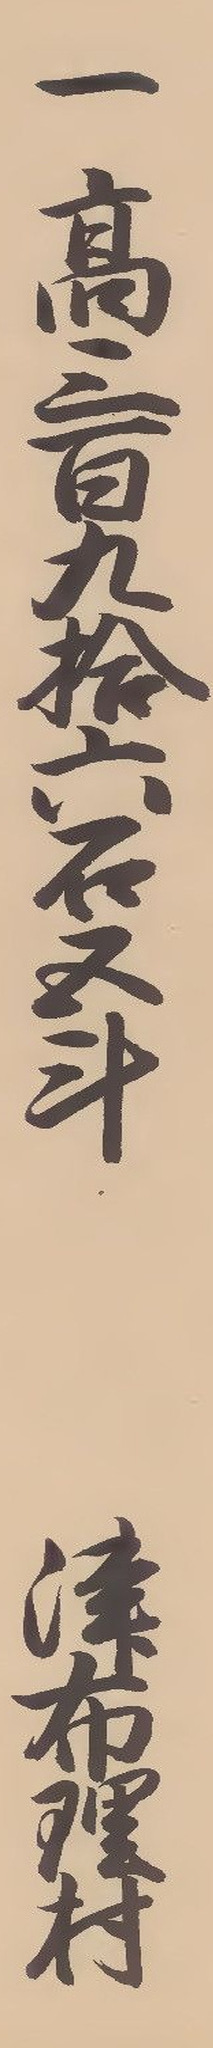一高三百九拾六石五斗津布理村
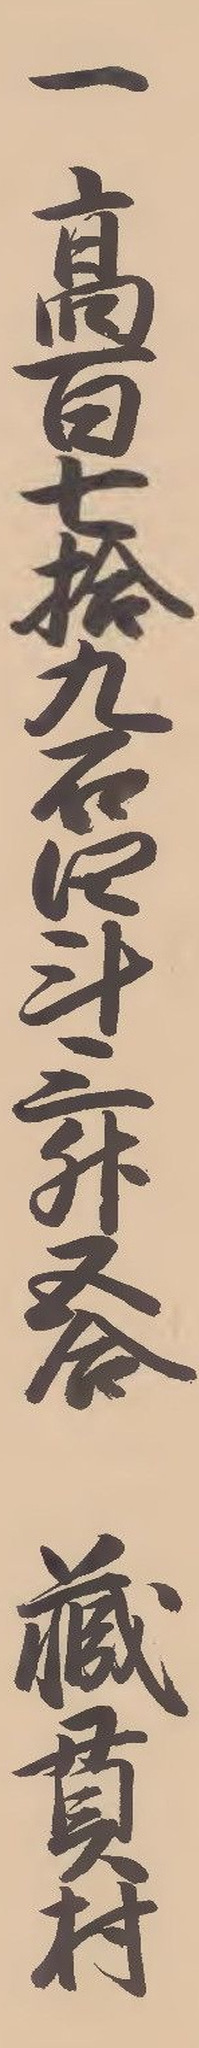一高百七拾九石四斗三升五合蔵貫村
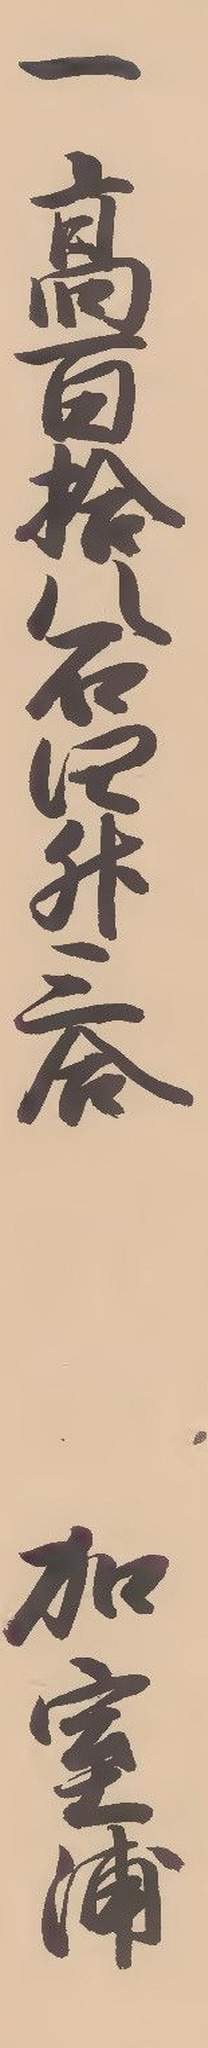一高百拾八石四升三合加室浦

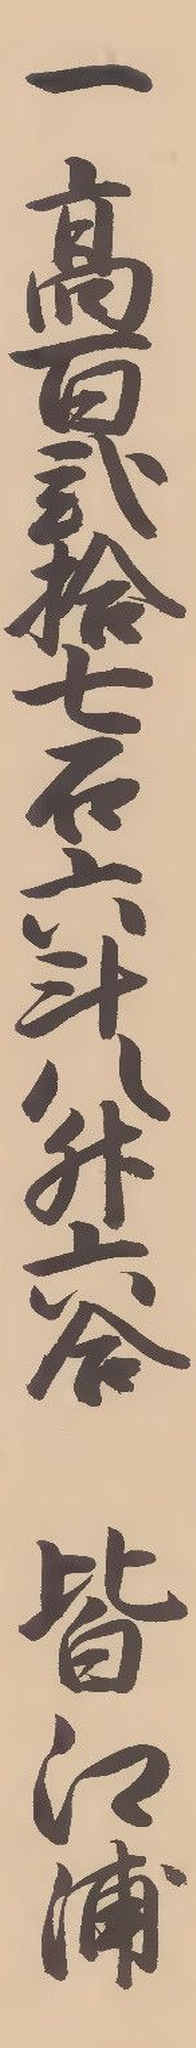一高百弐拾七石六斗八升六合皆江浦
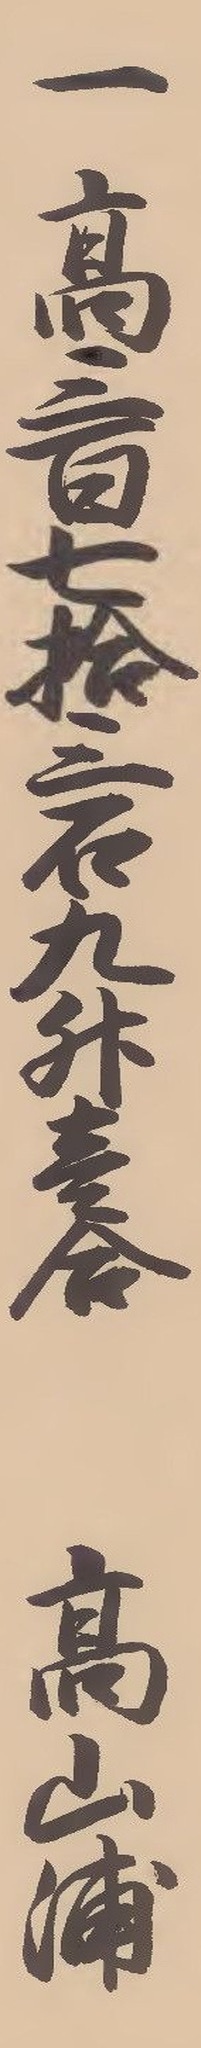一高三百七拾三石九升壱合高山浦
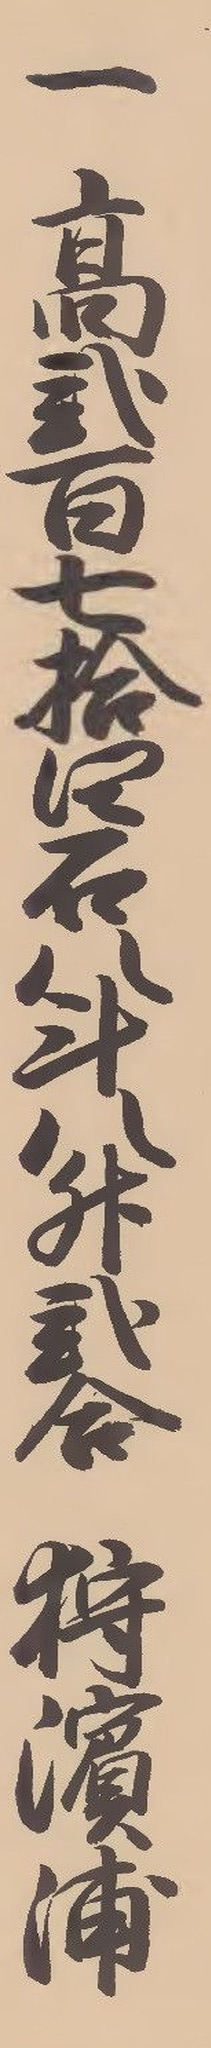一高弐百七拾四石八斗八升弐合狩浜浦
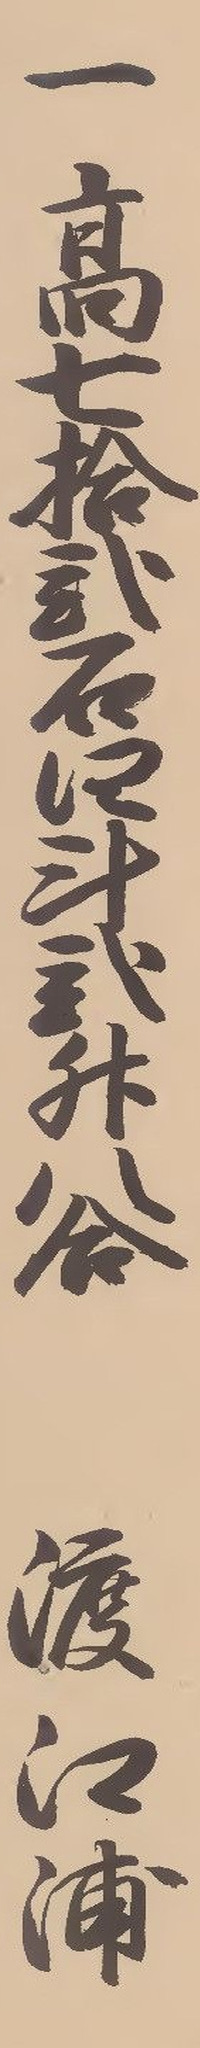一高七拾弐石四斗弐升八合渡江浦
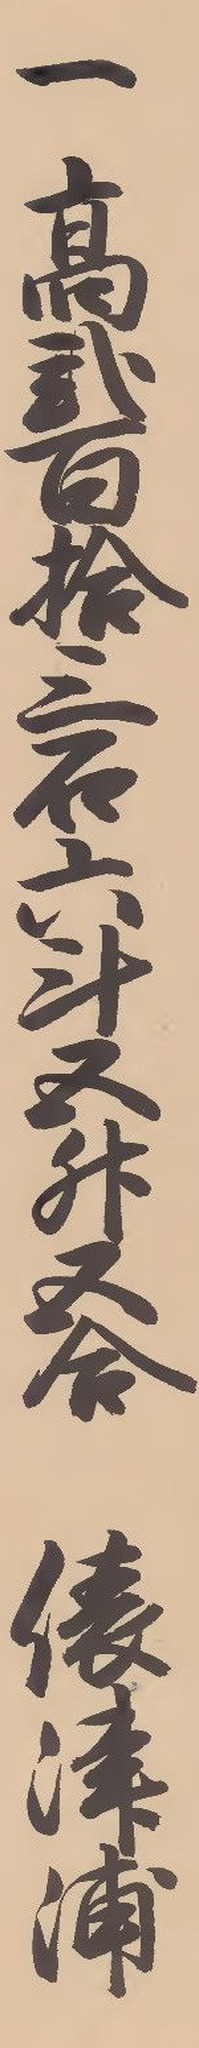一高弐百拾三石六斗五升五合俵津浦
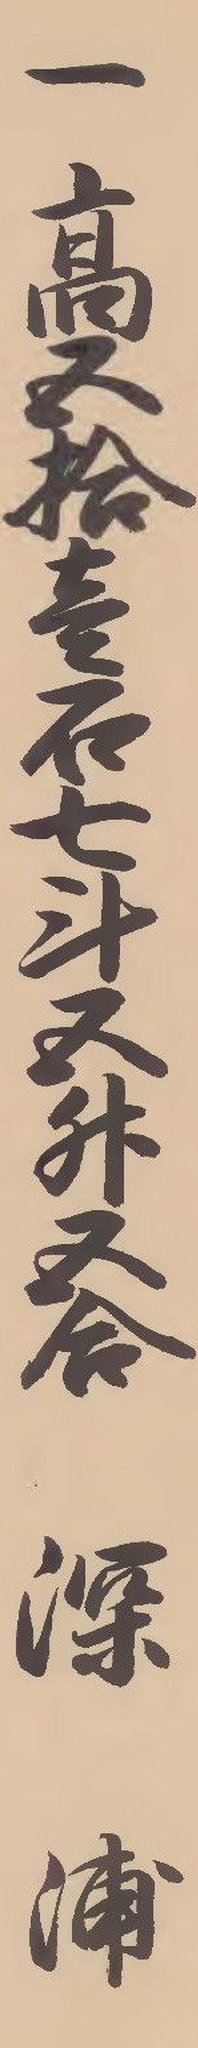一高五拾壱石七斗五升五合深浦
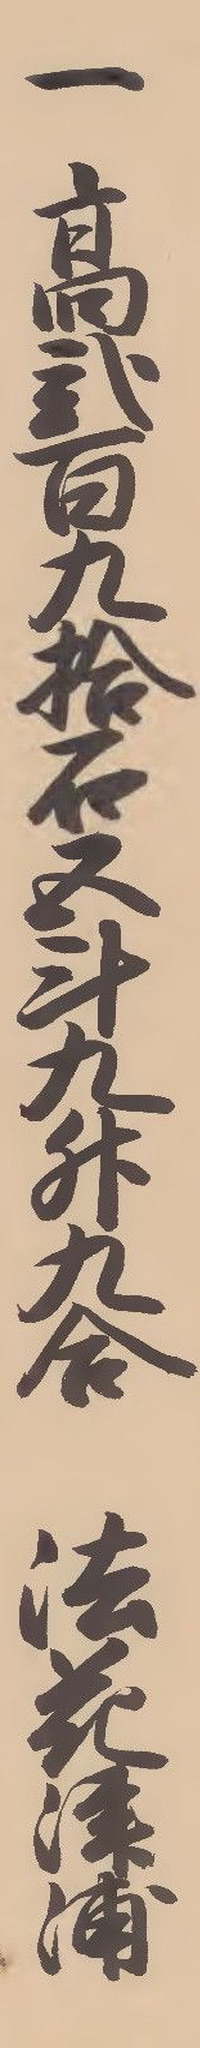一高弐百九拾石五斗九升九合法花津浦
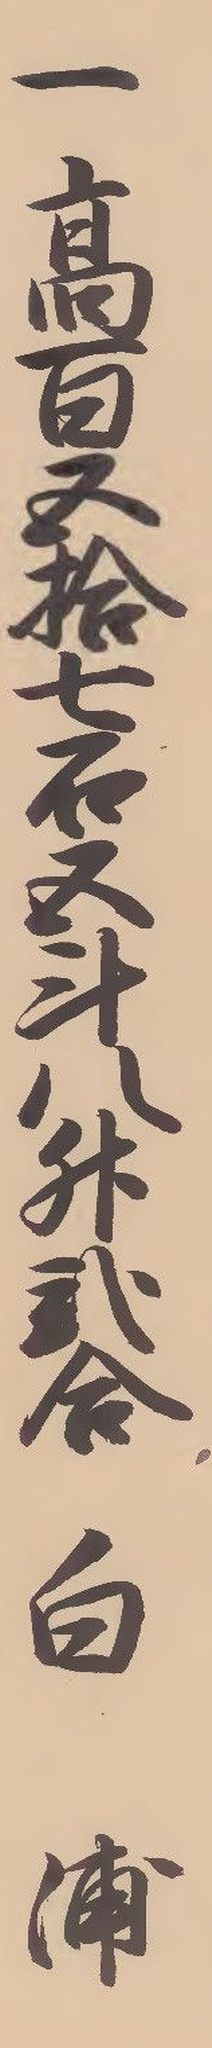一高百五拾七石五斗八升弐合白浦

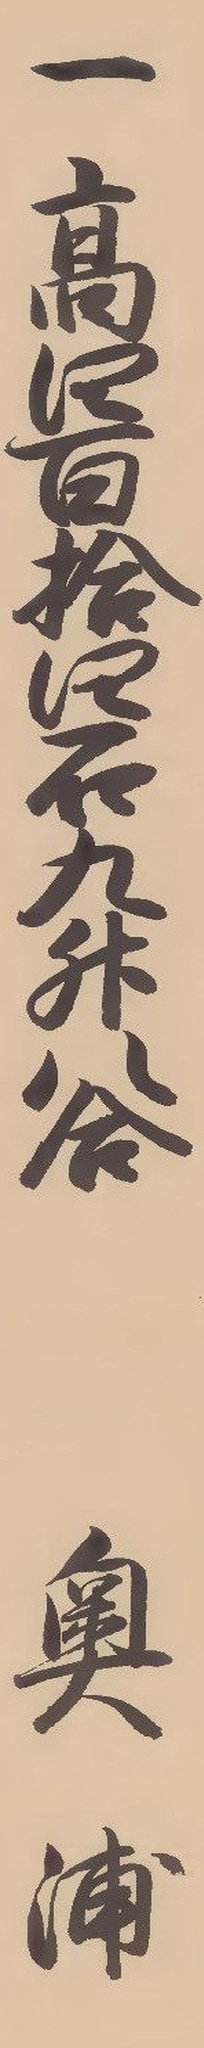一高四百拾四石九升八合奥浦
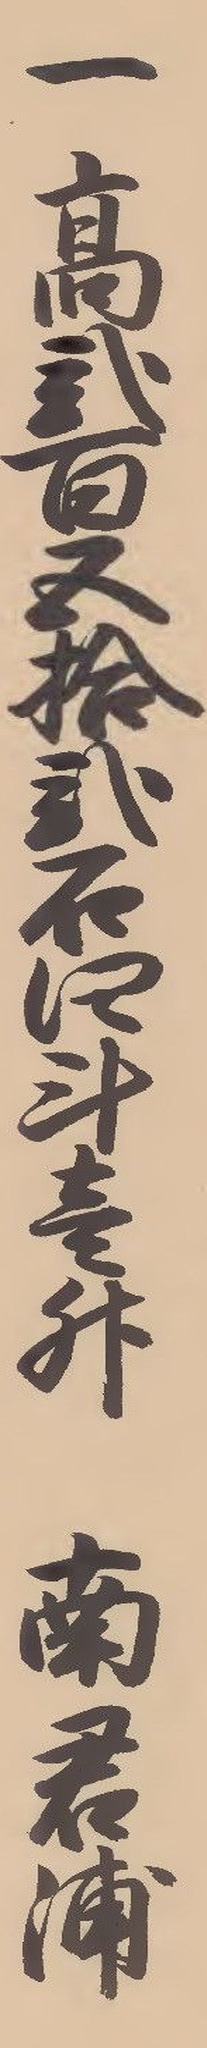一高弐百五拾弐石四斗壱升南君浦
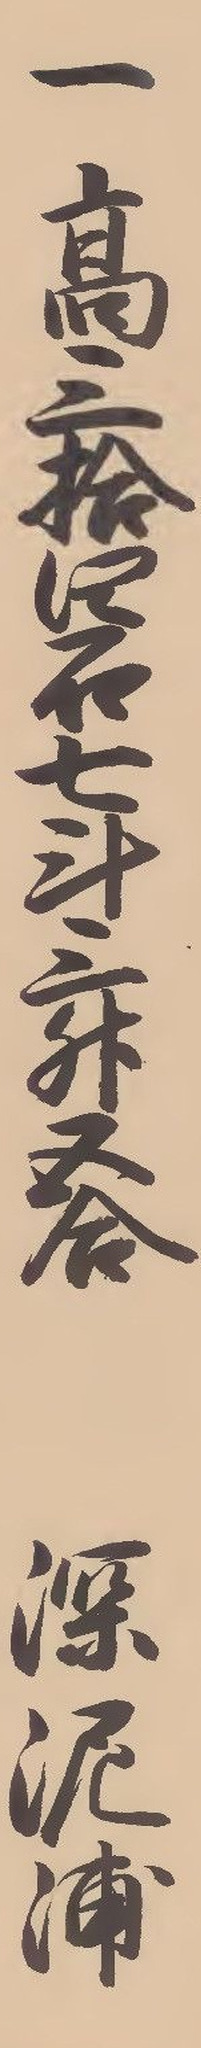一高三拾四石七斗三升五合深泥浦
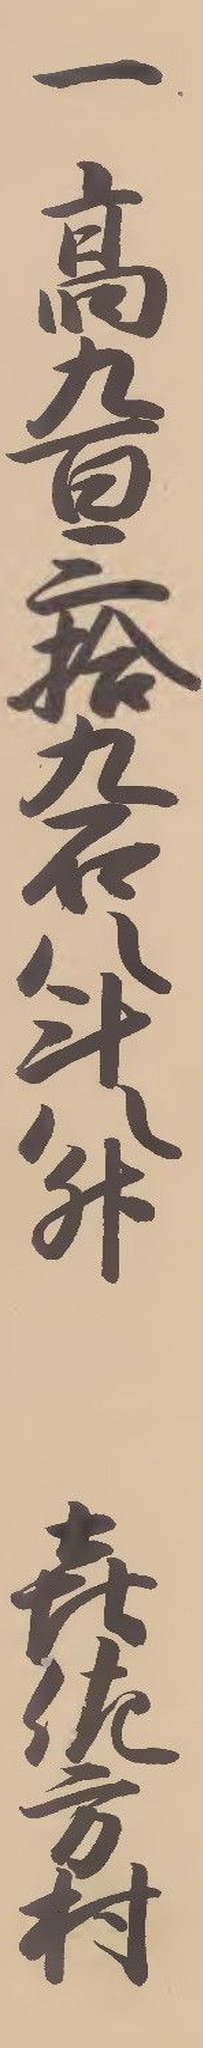一高九百三拾九石八斗八升喜佐方村
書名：伊予国郷帳
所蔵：国立公文書館 National Archives of Japan
